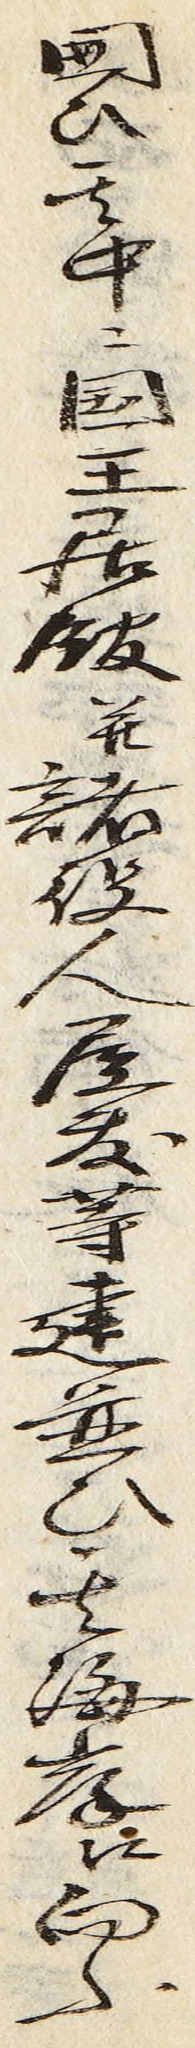囲ひ其中ニ国王居館幷諸役人屋敷等建並ひ其海岸江向ふ
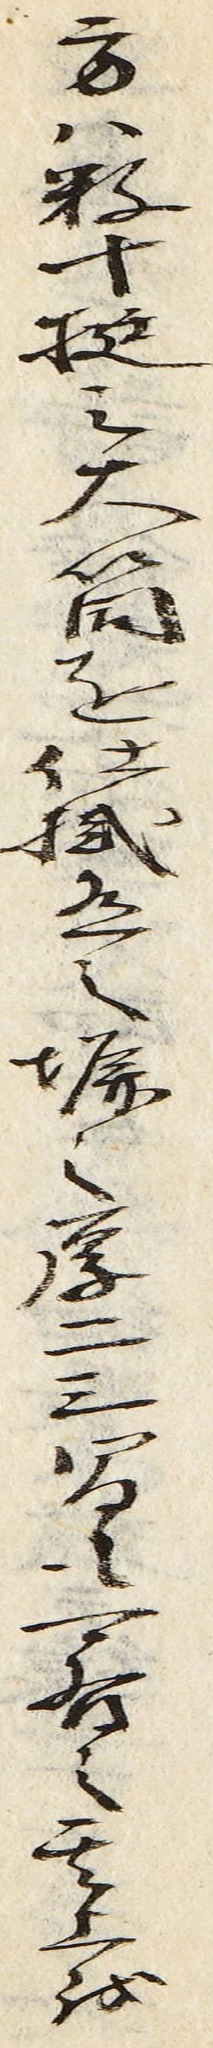方ハ数十挺之大筒を仕掛有之塀之厚二三間も可有之其上を
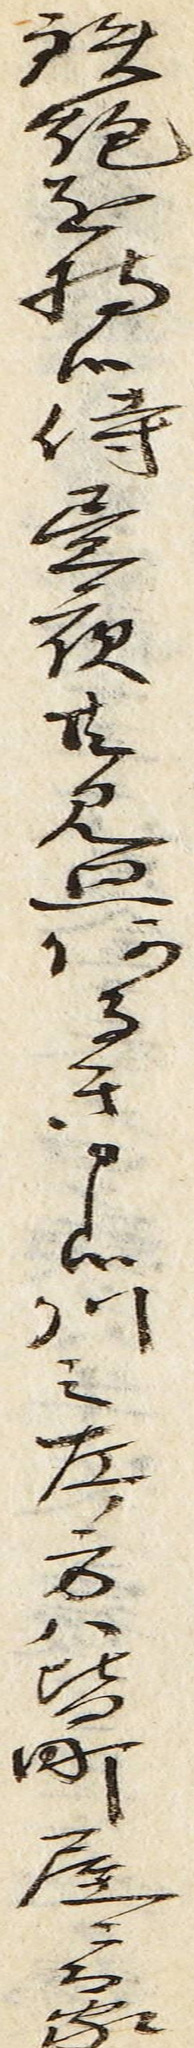鉄砲を持候侍昼夜共見廻あるき申候川之左ノ方ハ皆町屋ニ而家
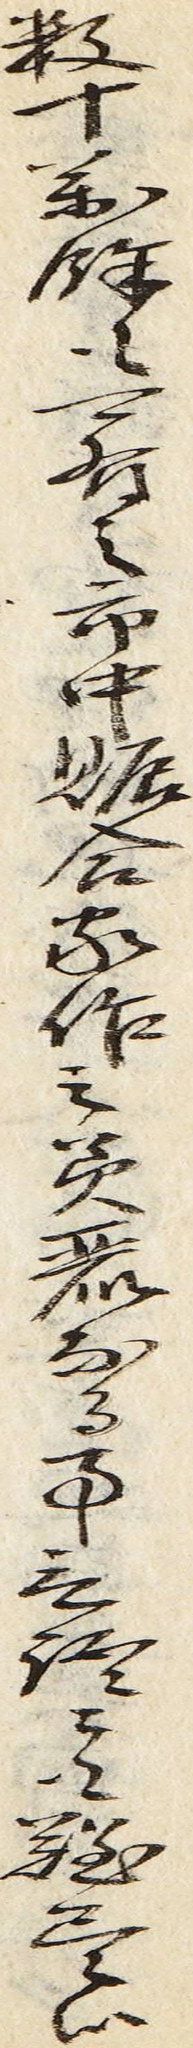数十万余も可有之市中賑合家作之美麗なる事言語ニも難尽候
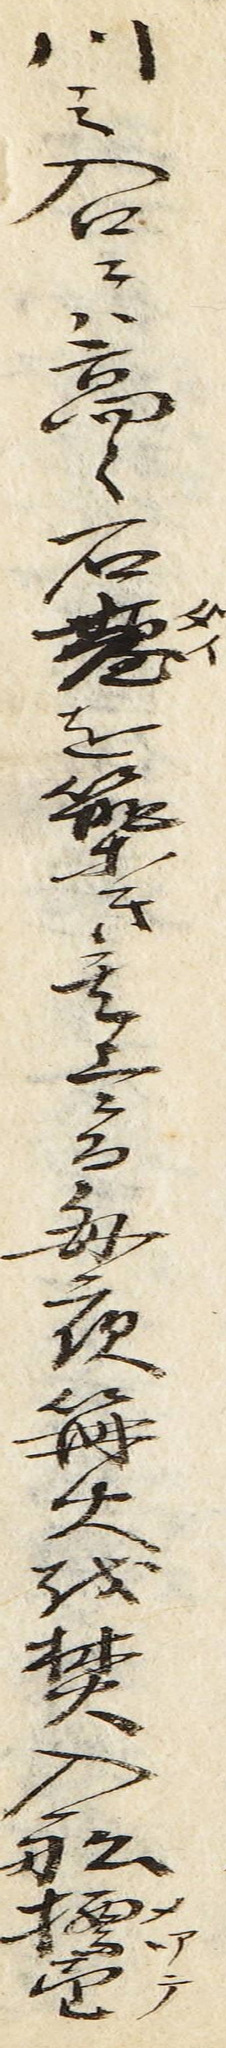川之入口ニハ高く石台を築き其上ニ而毎夜篝火を焚入船標望
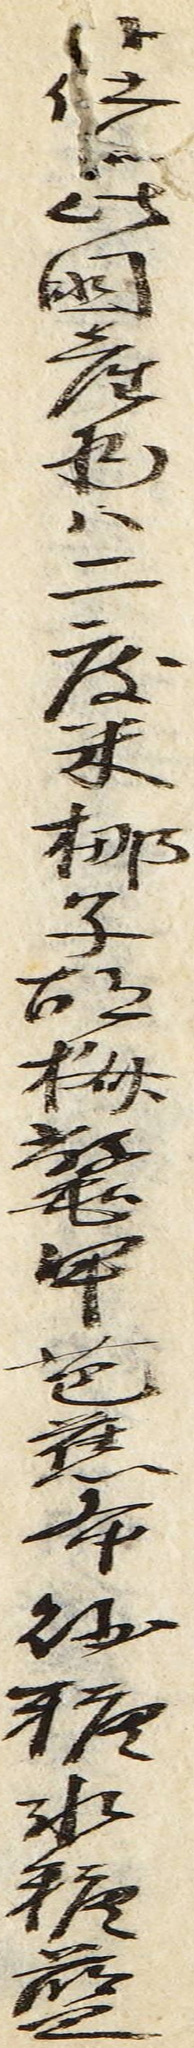ト仕候此国産物ハ二度米椰子胡椒鼈甲芭蕉布砂糖水糖藍
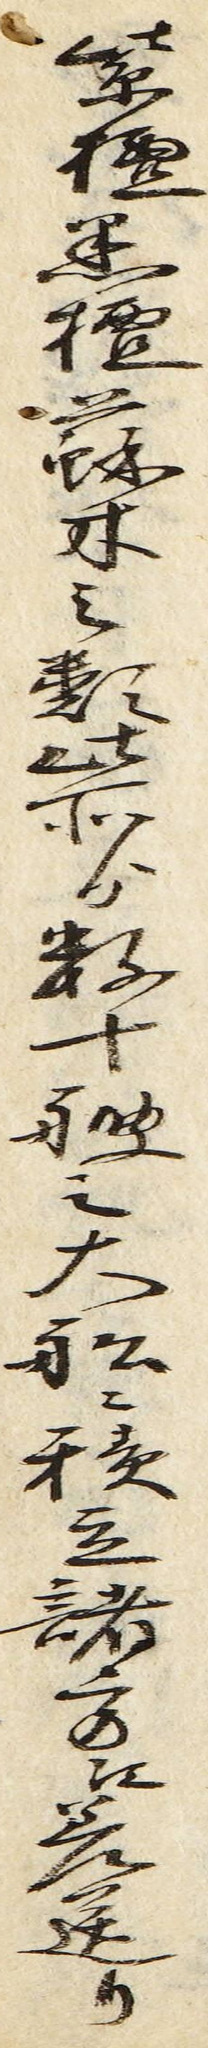紫檀黒檀蘇木之類此所ゟ数十艘之大船ニ積立諸方江差送り

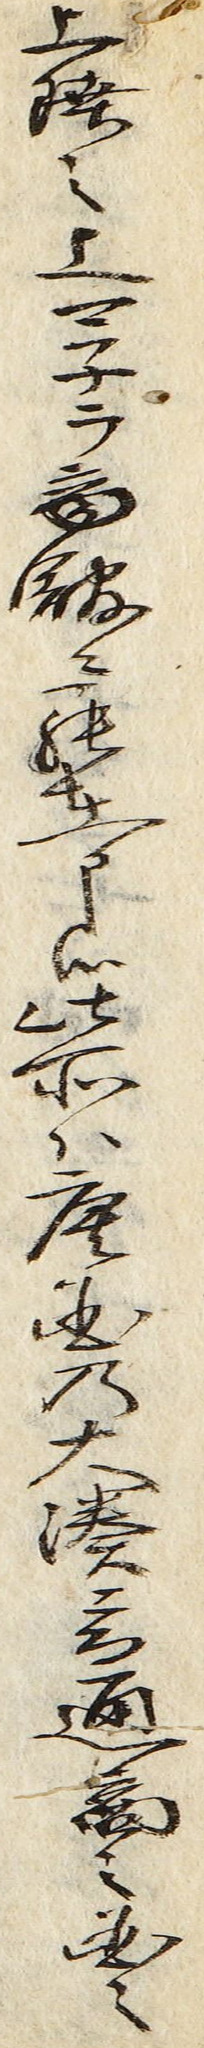上陸之上マネラ商館ニ罷在申候此所ハ唐国の大湊ニ而通商之国々
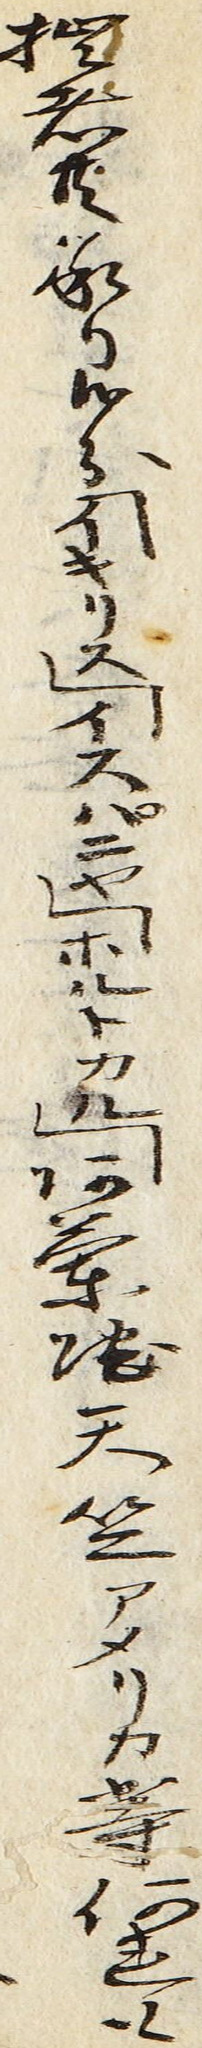拙者共承り候分「イキリス」「イスパニア」「ホルトカル」「阿蘭陀天竺アメリカ等何れも
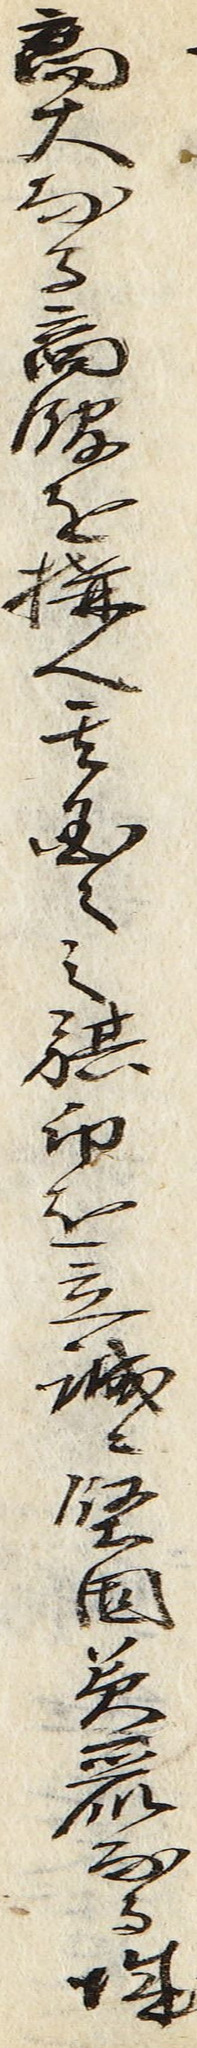高大なる商館を構へ其国々之旗印を立誠ニ堅固美麗なる城
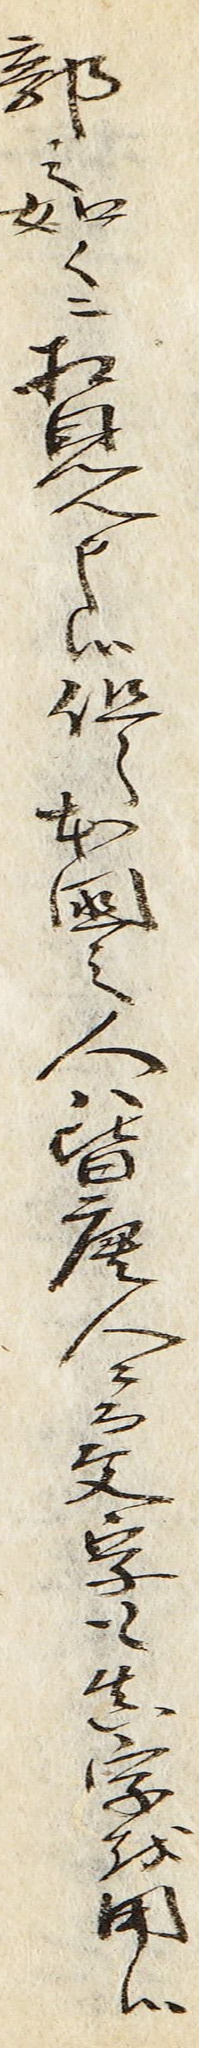郭之如くニ相見へ申候但し本国之人ハ皆唐人ニ而文字も真字を用候
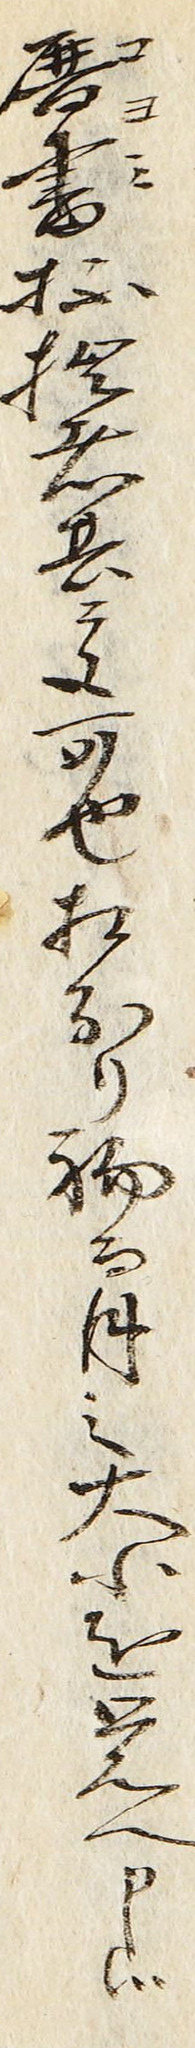暦書抔拙者共ニも可也相分り初而月之大小を覚へ申候
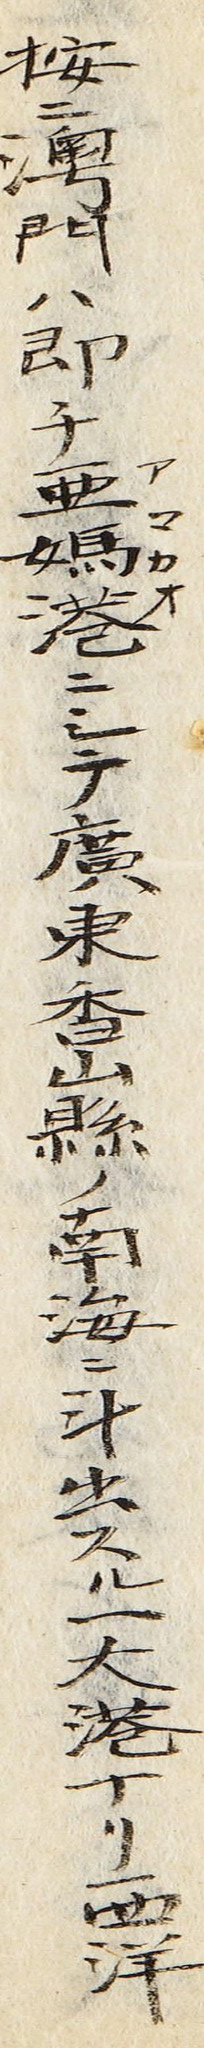按ニ澳門ハ即チ亜媽港ニシテ広東香山県ノ南海ニ斗出スル一大港ナリ西洋
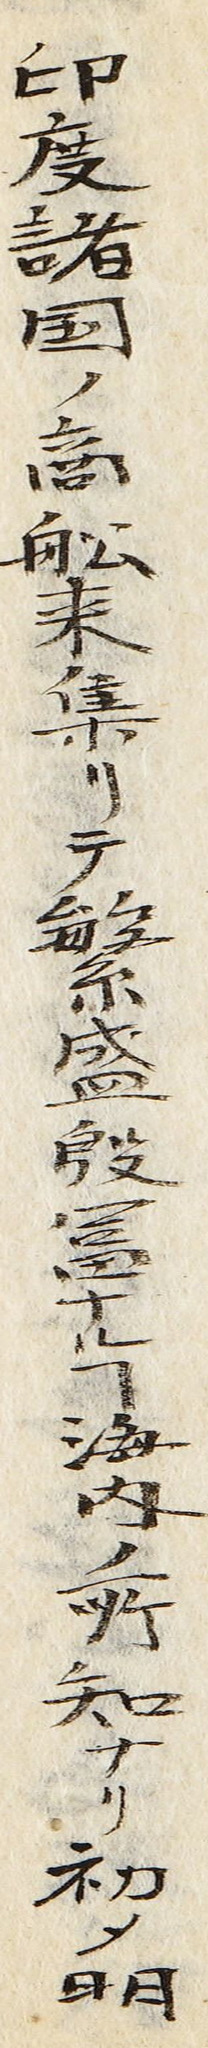印度諸国ノ商船来集リテ繁盛殷富ナルコト海内ノ所知ナリ初メ明
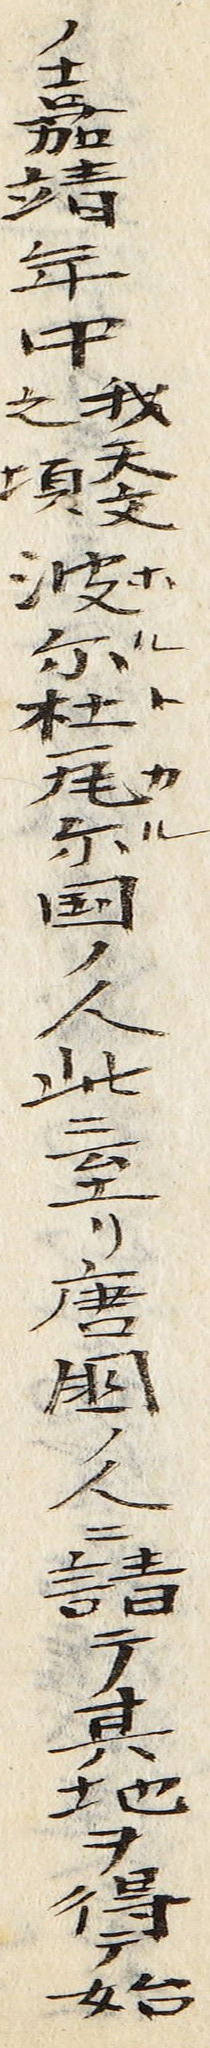ノ嘉靖年中我天文之頃波尓杜瓦尓国ノ人此ニ至リ唐国ノ人ニ請テ其地ヲ得テ始
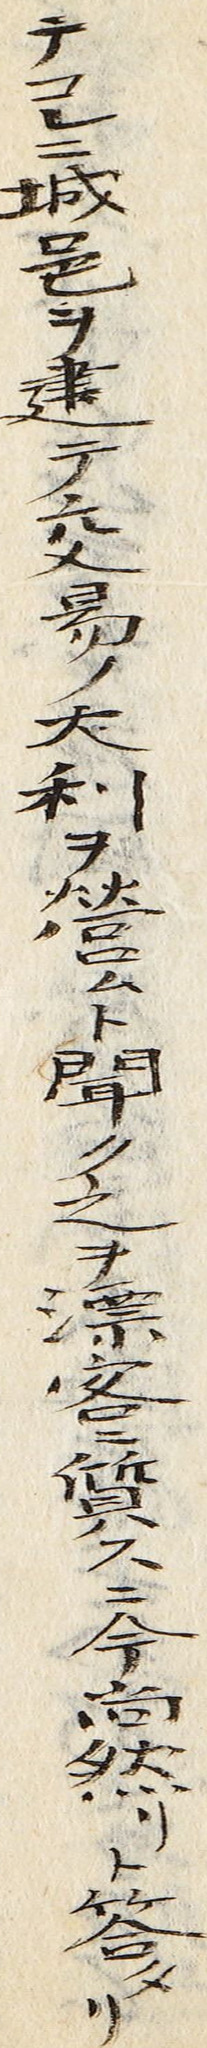テコレニ城邑ヲ建テ交易ノ大利ヲ営ムト聞ク之ヲ漂客ニ質スニ今尚然リト答タリ
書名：漂流呂宋国記
